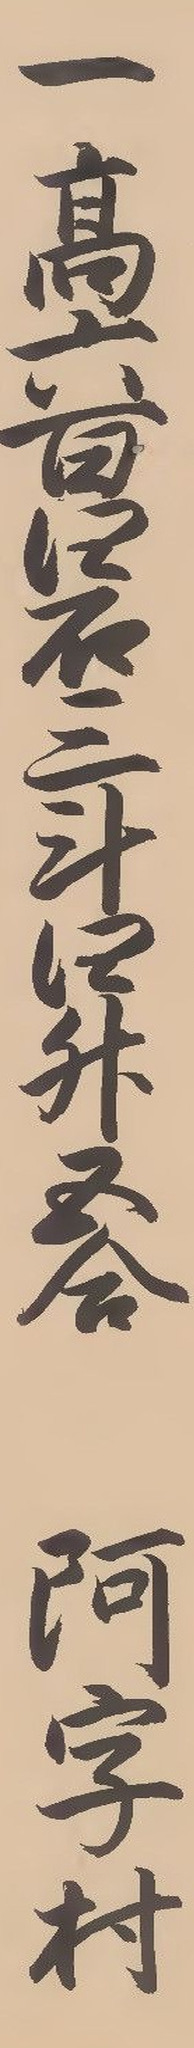一高六百四石三斗四升五合阿字村
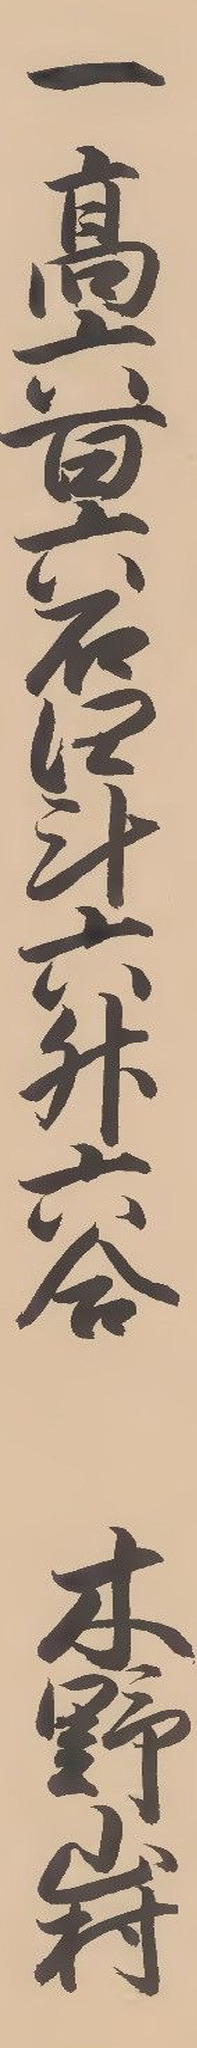一高六百六石四斗六升六合木野山村
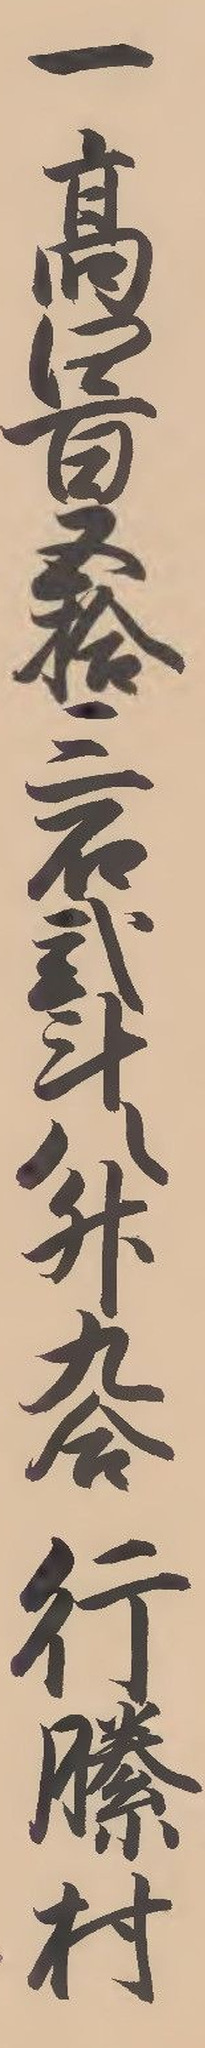一高四百五拾三石弐斗八升九合行縢村

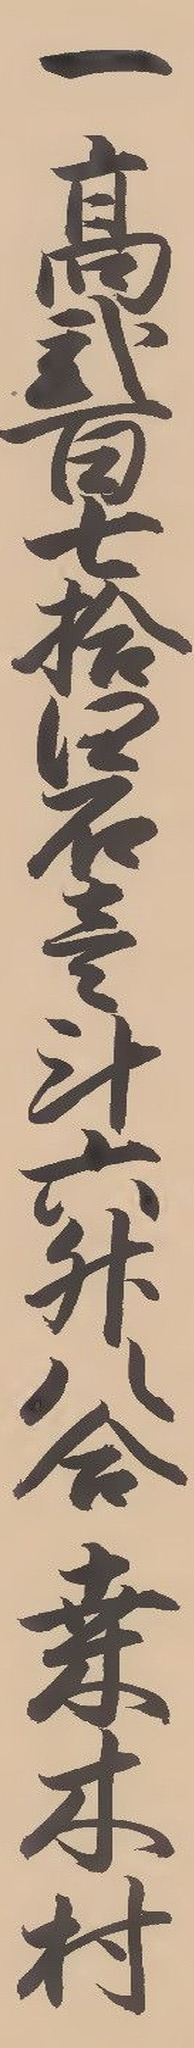一高弐百七拾四石壱斗六升八合桑木村
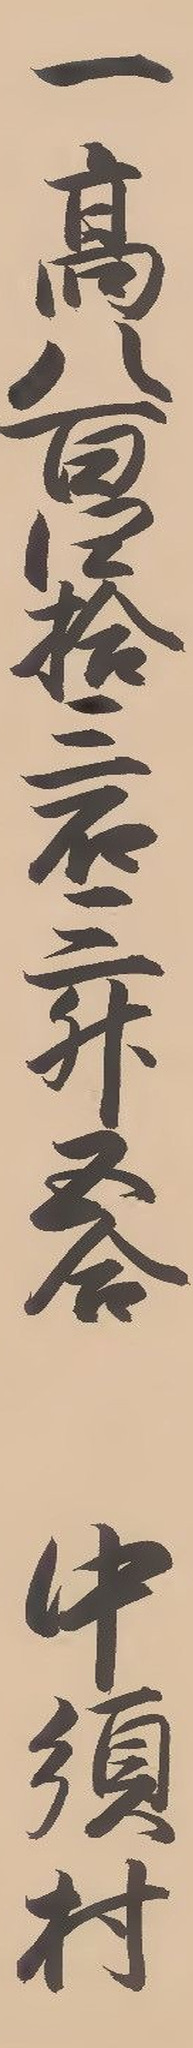一高八百四拾三石三升五合中須村
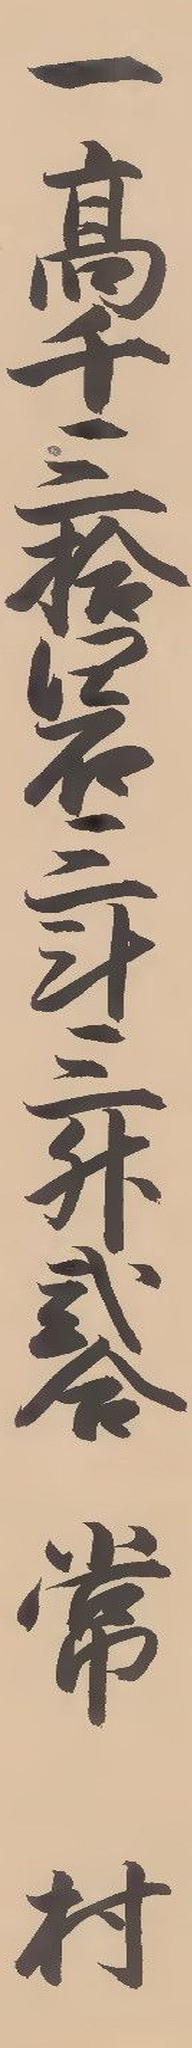一高千三拾四石三斗三升弐合常村
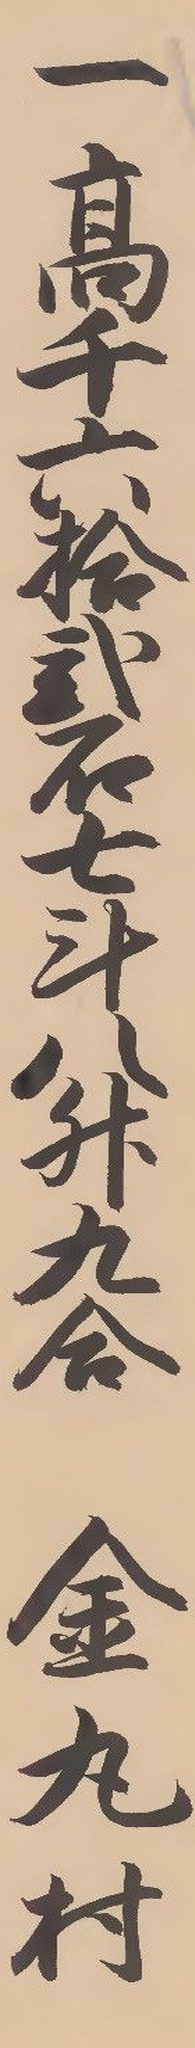一高千六拾弐石七斗八升九合金丸村
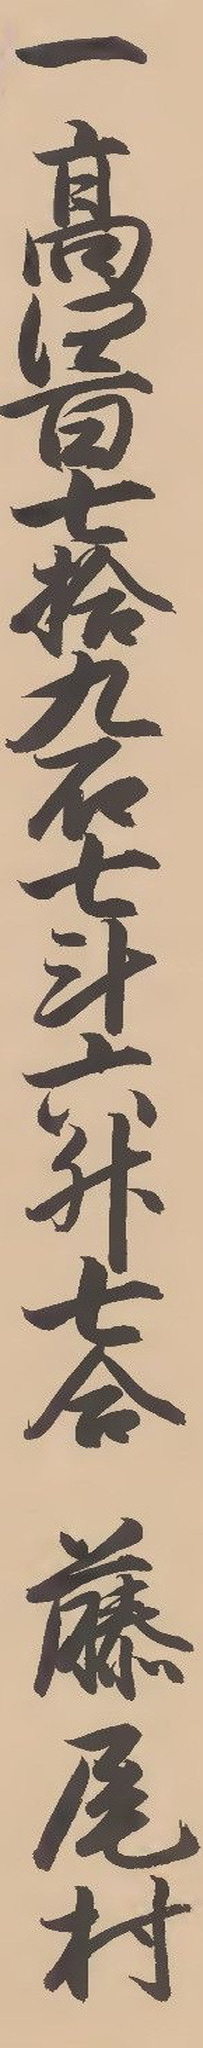一高四百七拾九石七斗六升七合藤尾村
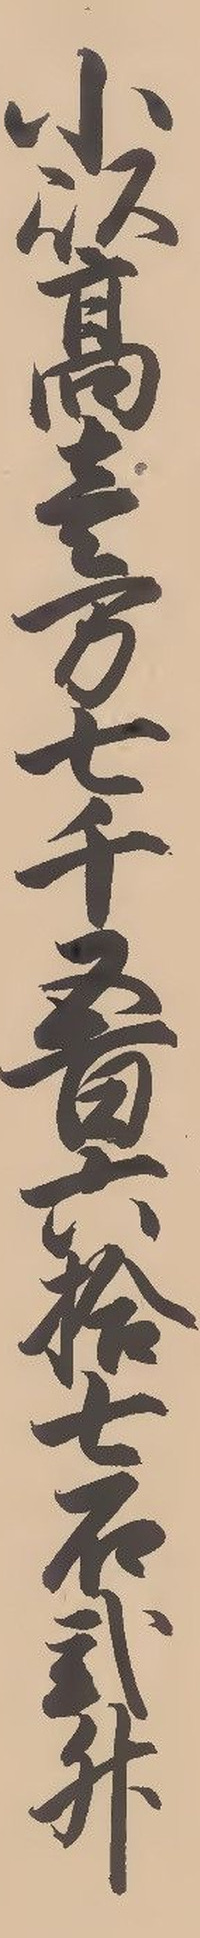小以高壱万七千五百六拾七石弐升

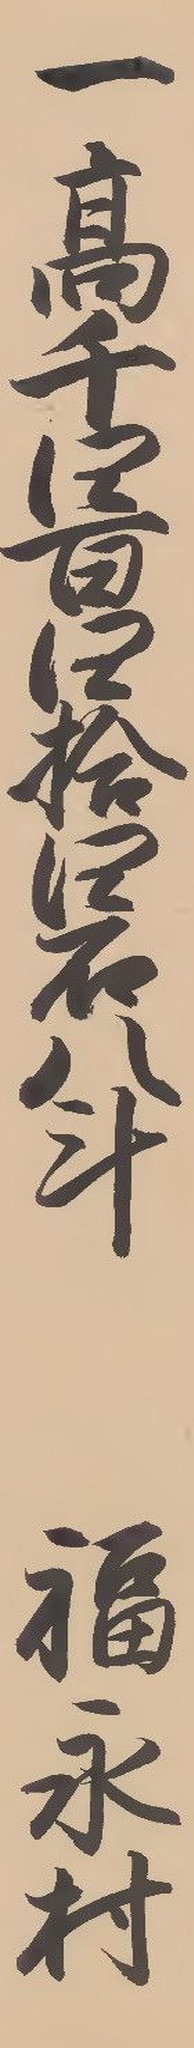一高千四百四拾四石八斗福永村
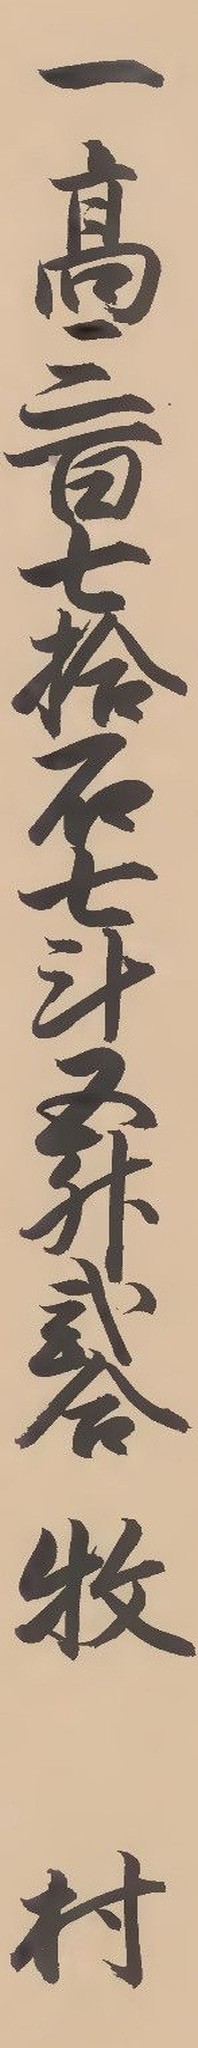一高三百七拾石七斗五升弐合牧村
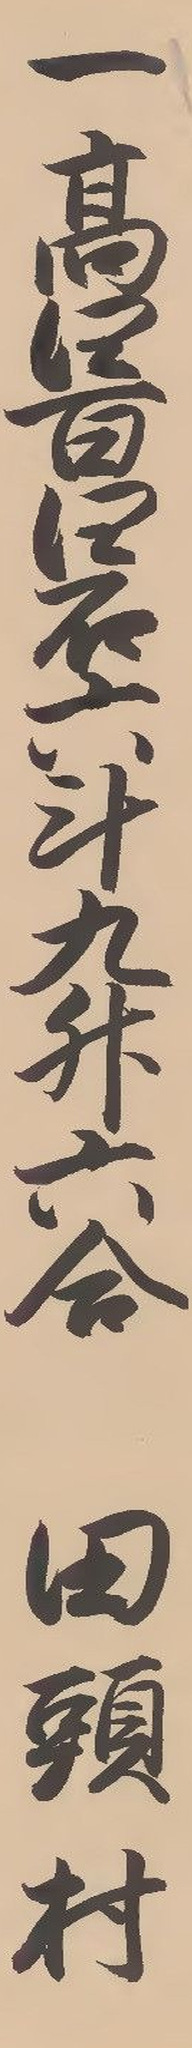一高四百四石六斗九升六合田頭村
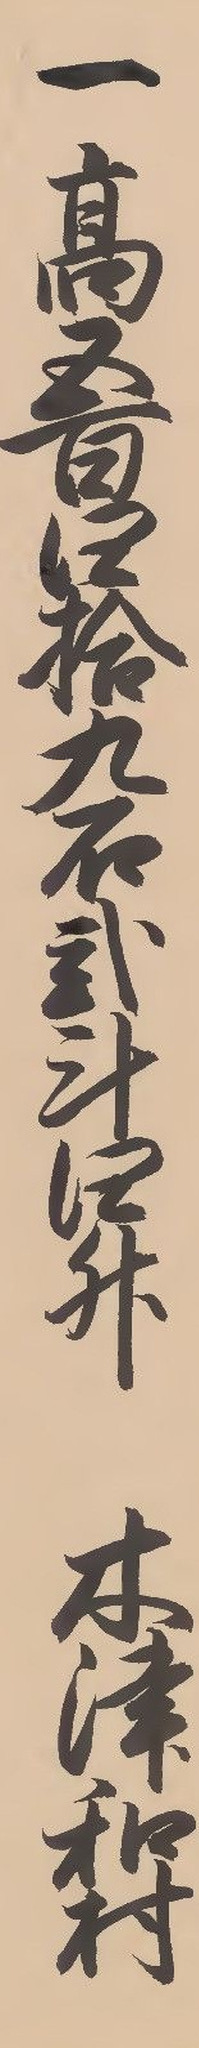一高五百四拾九石弐斗四升木津和村
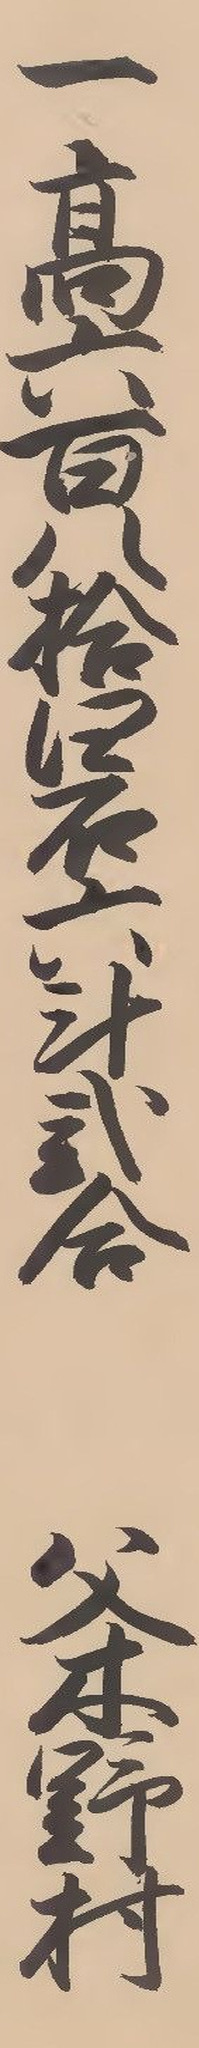一高六百八拾四石六斗弐合父木野村
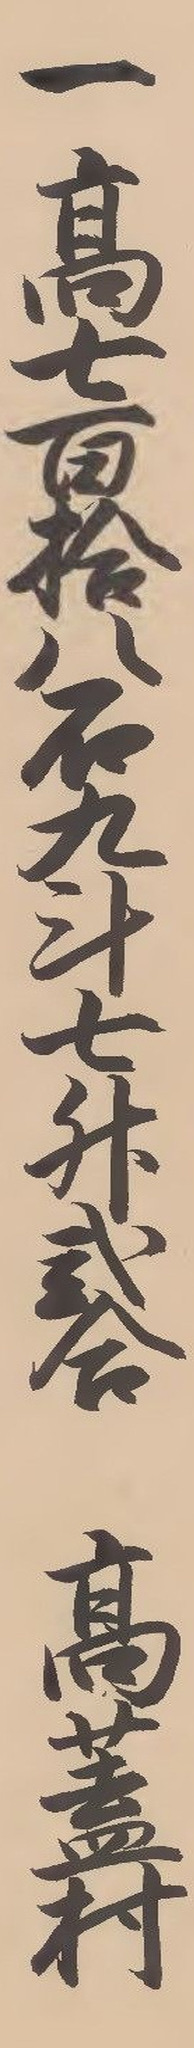一高七百拾八石九斗七升弐合高蓋村
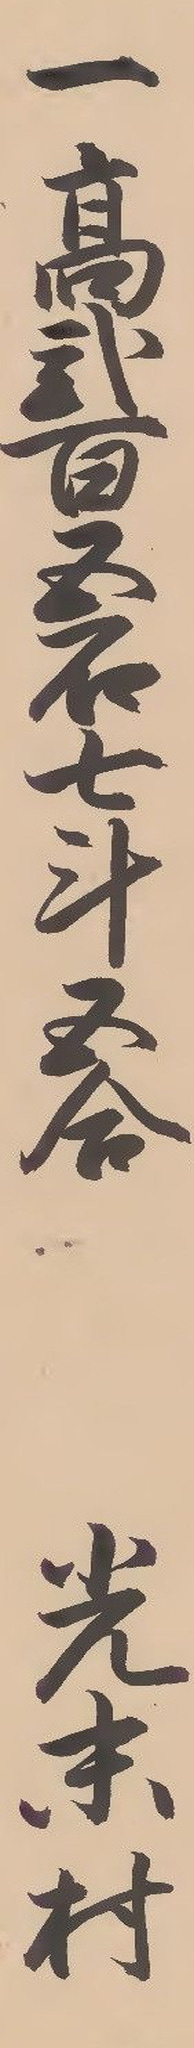一高弐百五石七斗五合光末村
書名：備後国郷帳
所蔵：国立公文書館 National Archives of Japan
